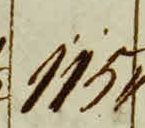115
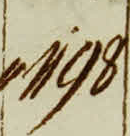198
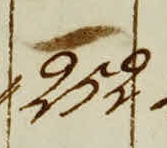252
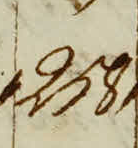258
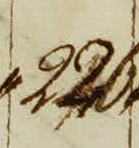226
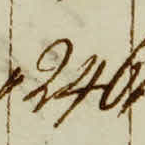246
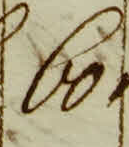60
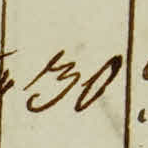30
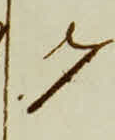7
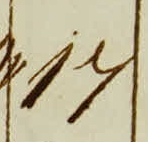17
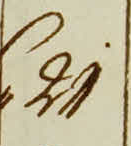21
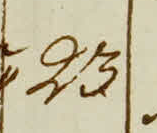23
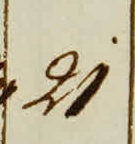21
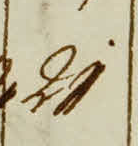21
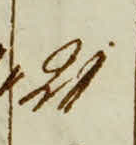21
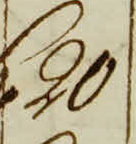20
